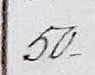50
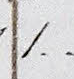1.
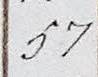57
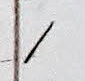1
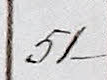51
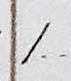1.
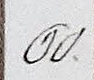60.
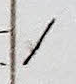1
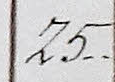25
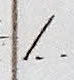1.
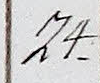24
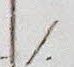1.
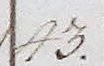43.
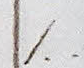1.
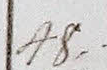48.
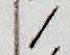1
